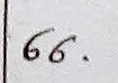66.
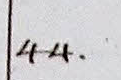44.
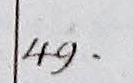49.
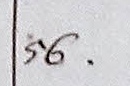56.
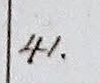41.
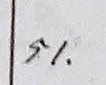51.
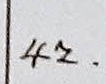42
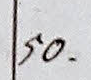50
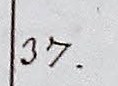37.
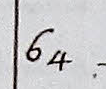64
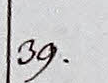39.
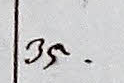35.
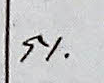51.
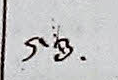53.
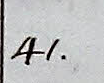41.
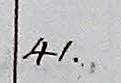41.
